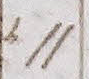11
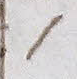1
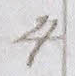4
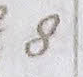8
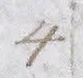4
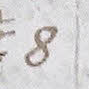8
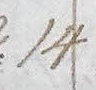14
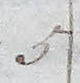5
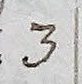3
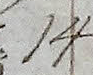14
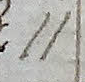11
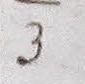3
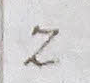2
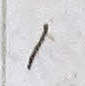1
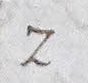2
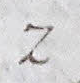2
